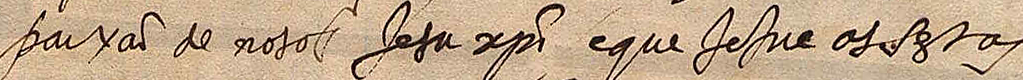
paixaõ de nosso sr Jesu xpō, e que JeJue as sestas
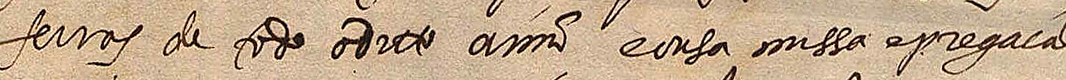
feiras de todo o ditto annō, e ousa missa e pregaçaõ
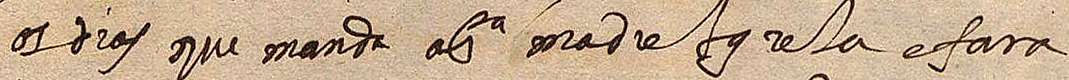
os dias que manda a sta madre IgreIa, e fara
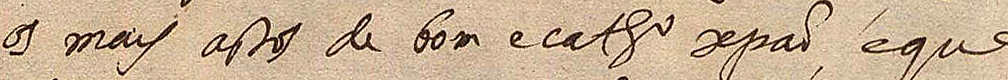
os mais actos de bom e catho xpaõ, e que
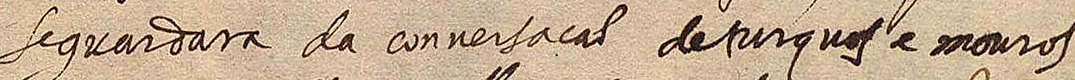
se guardara da conuersaçaõ de turquos e mouros
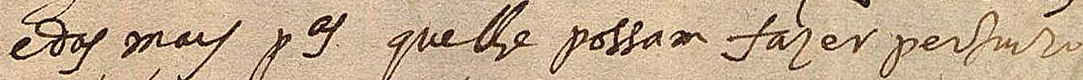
e das mais pas que lhe possam fazer perJuizo
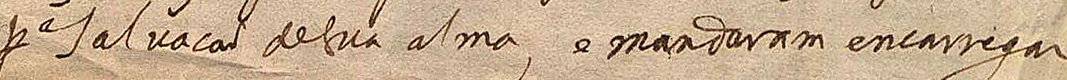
ꝑa saluaçaõ de sua alma, e mandaram encarregar
